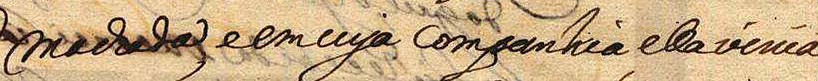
machada, e em cuja companhia, ella viuia
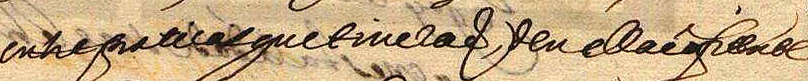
entre praticas que tiueraõ, deu ella cōfitente
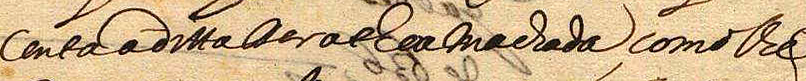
conta á ditta Dorothea machada, como lhe
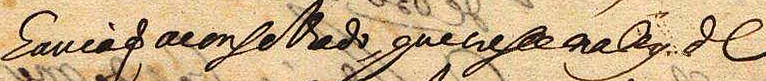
hauiaõ aconselhado, que cresse na ley de
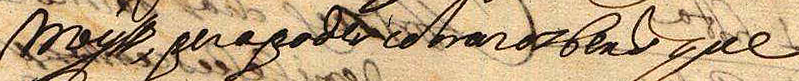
Moyses, pera poder cobrar os bens que
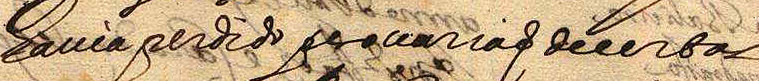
hauia perdido per occaziaõ de certas
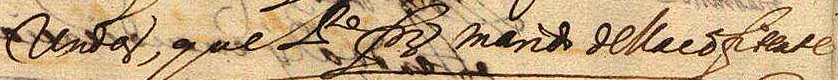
Vendas, que Po frz̄ marido della cōfitente
